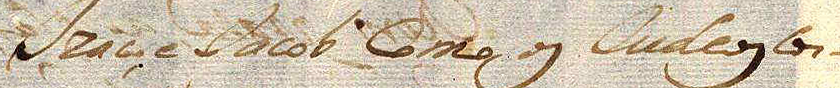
Izac, e Iacob Como os Iudeos Cos
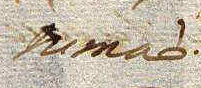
tumaõ?
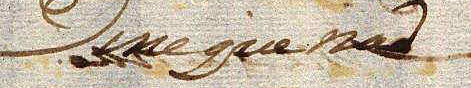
Disse que naõ
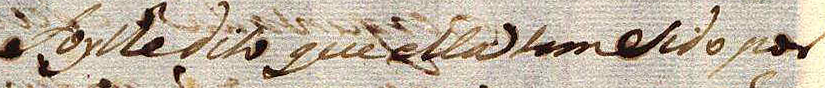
Foylhe dito que ella tem sido por
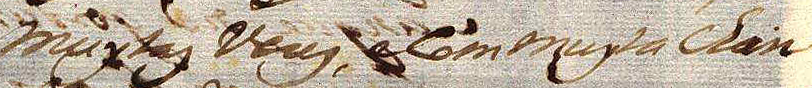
muytas Vezes, e com muyta chari
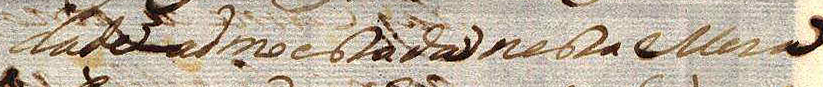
dade admoestada nesta Meza
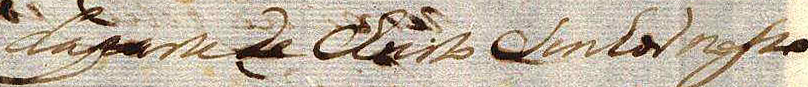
da parte de christo senhor nosso
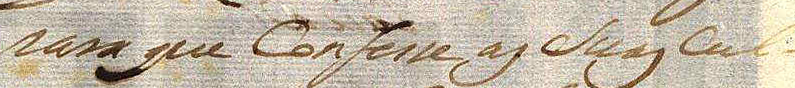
para que confesse as suas cul
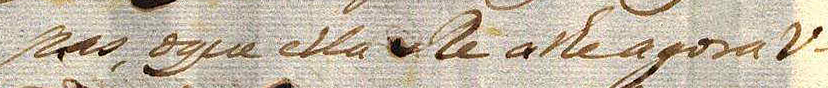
pas, o que ella Re athe agora V
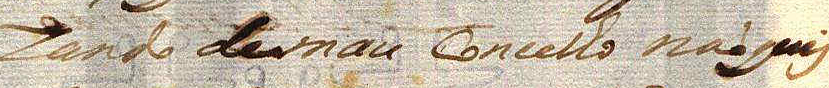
Zando de mau concelho naõ quis
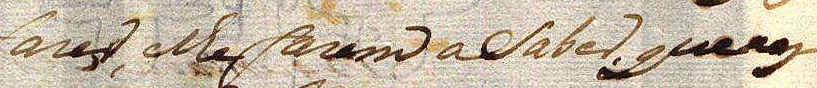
fazer, e lhe fazem a saber, que nes
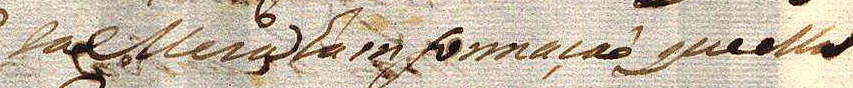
ta Meza ha informaçaõ que ella
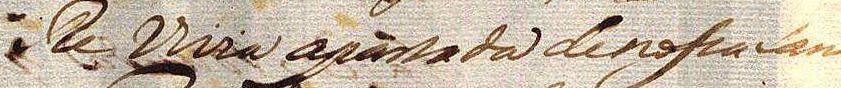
Re Vivia apartada de nossa san
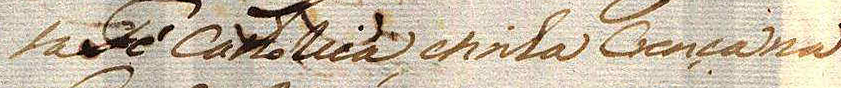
ta Fé catholica, e tinha crença na
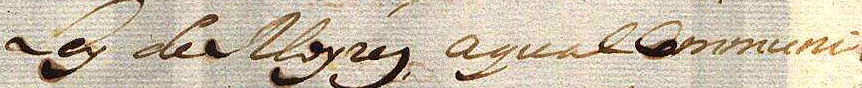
Ley de Moyzes, a qual communi
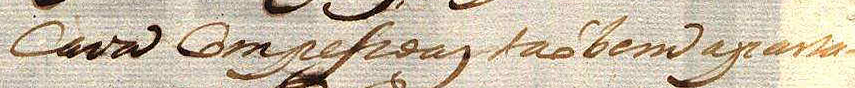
cava com pessoas taõbem aparta
